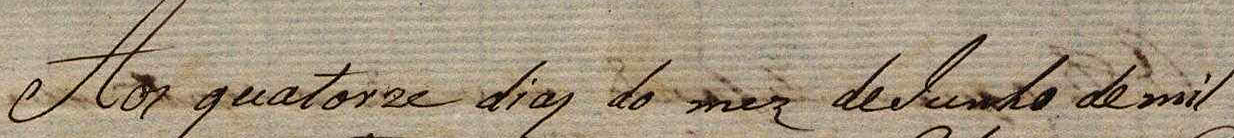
Aos quatorze dias do mez de Iunho de mil
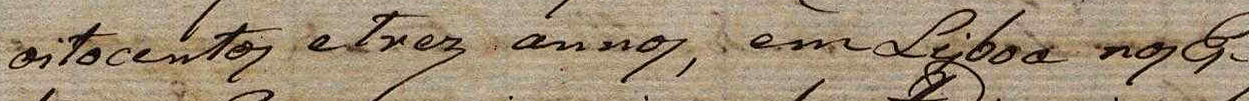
oitocentos e trez annos, em Lisboa nos Es
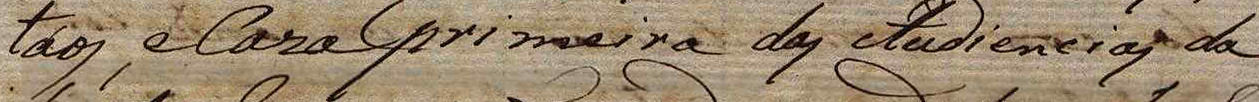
táos, e Caza primeira das Audiencias da
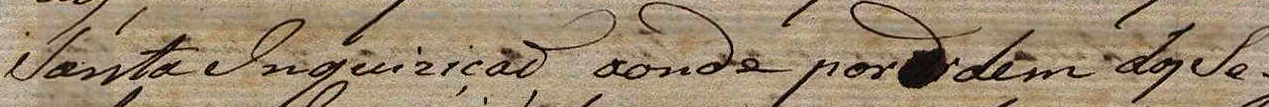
Santa Inquiziçaõ, aonde por o_dem dos Se
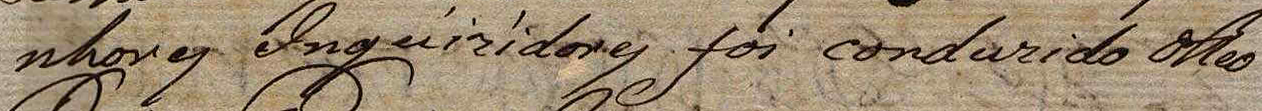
nhores Inquizidores foi conduzido o Reo
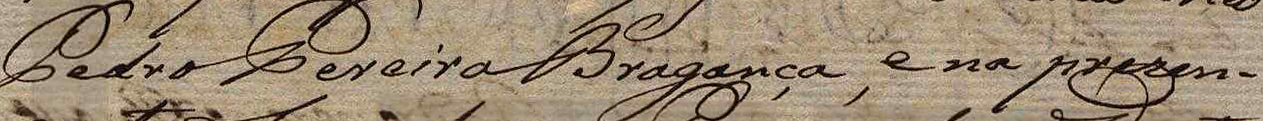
Pedro Pereira Bragança, e na prezen
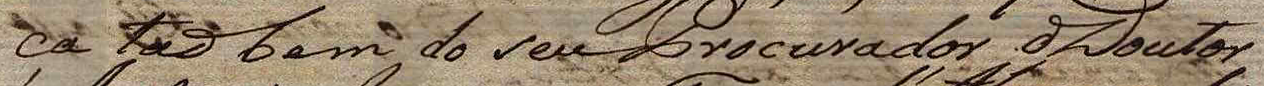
ça taõbem do seu Procurador o Doutor
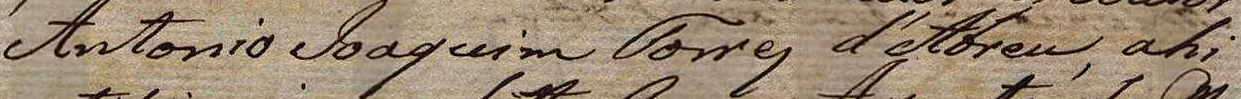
Antonio Ioaquim Torres d'Abreu, ahi
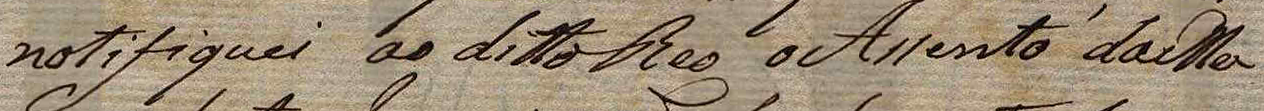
notifiquei ao ditto Reo o Assento da Me
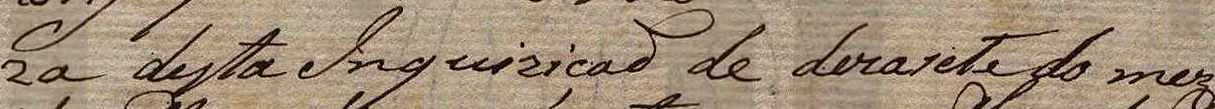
za desta Inquiziçaõ de dezasete do mez
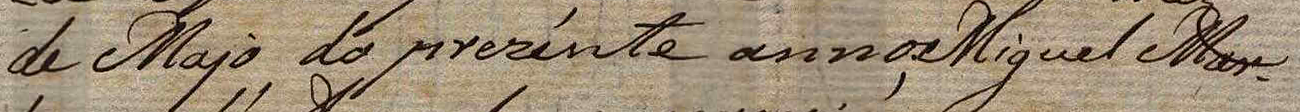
de Majo do prezente anno; Miguel Mar
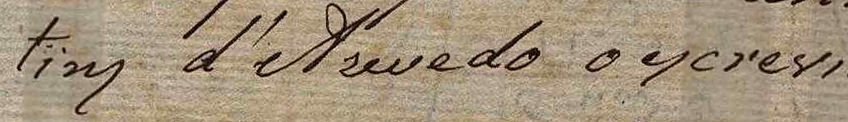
tins d'Azevedo o escrevi.
